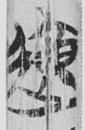○（就）
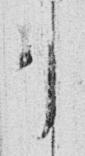人
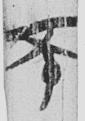不
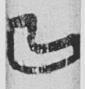曲
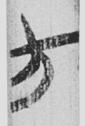方（防）
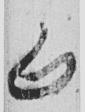㠯（以）
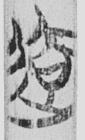迲（去）
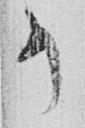人
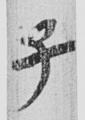子
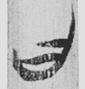曰
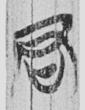君
